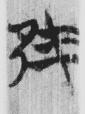隹
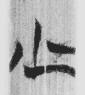少
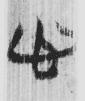心
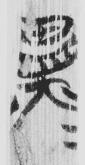翼=
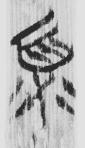寡
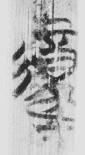復
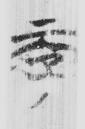{亓子}
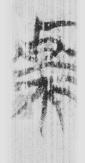{真天}（祗）
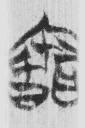{尒䎽}
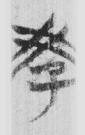𡥈
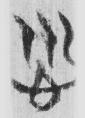{川心}
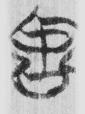{余口}
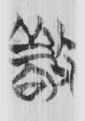敬
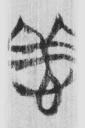恙
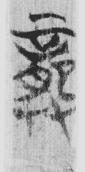龏
